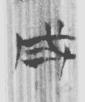{戊二}
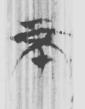不
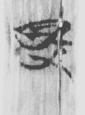𠭁
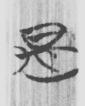是
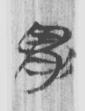{胃刀}
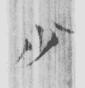少
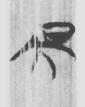{日夨}
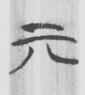亓
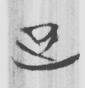疋
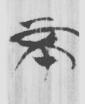不
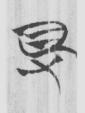𠭁
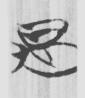是
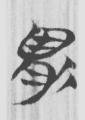{胃刀}
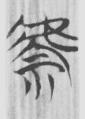{虍示}
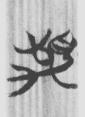爭
